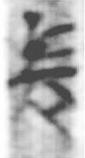長
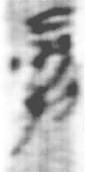腸
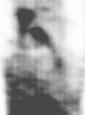人
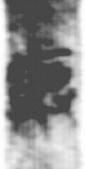與
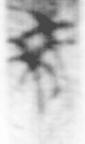杙
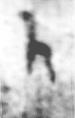人
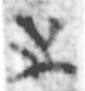之
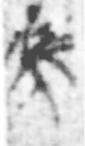馬
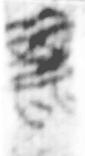麗
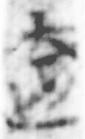○（踦）
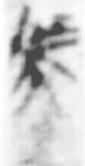馬
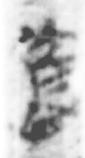舊
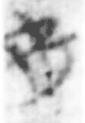𡚦
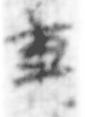車
